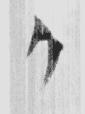人
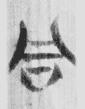同
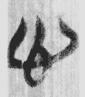心
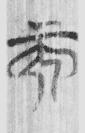而
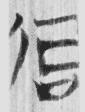{人己口}
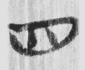四
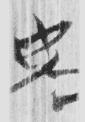𡚦
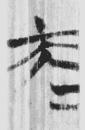夫=
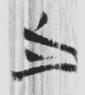之
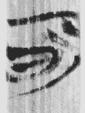明
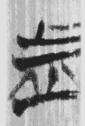者
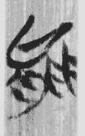能
